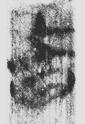旨
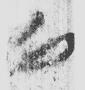㠯（以）
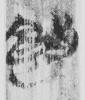飿
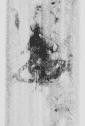身
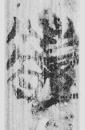體
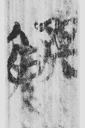{身巽}
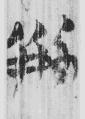㔙
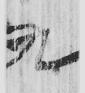九
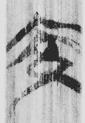窔
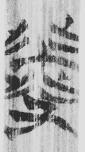發
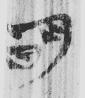明
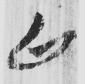㠯（以）
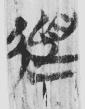道
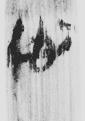心
